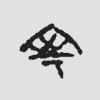室
